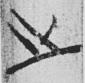之
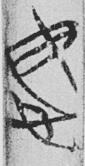○（謀）
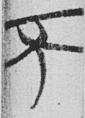不
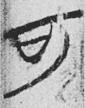可
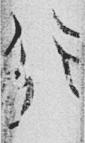行
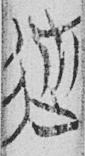述（怵）
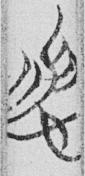惕
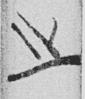之
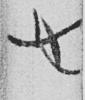心
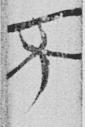不
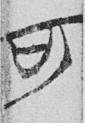可
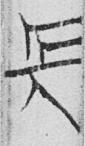長
